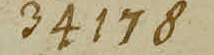34178
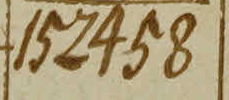15248
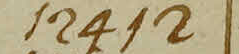12412
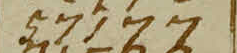57177
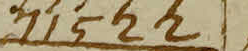71522
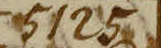5125
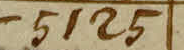5125
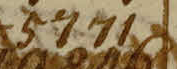5771
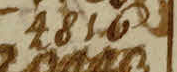4816
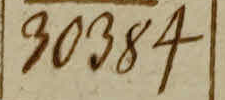30384
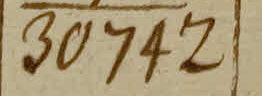30742
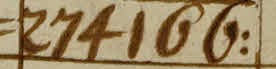274166
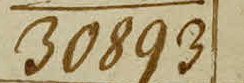30893
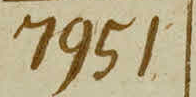7951
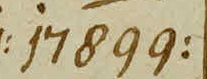17899
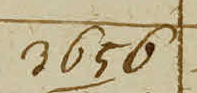3656
